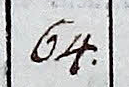64.
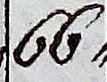66
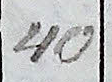40
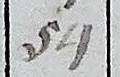54
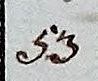53
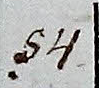54
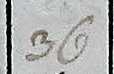36
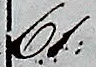61
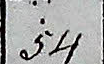54
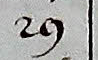29
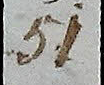51
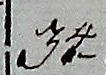34
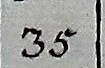35
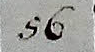56
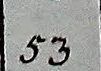53
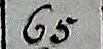65
